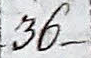36
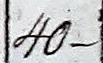40
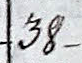38
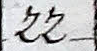22
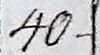40
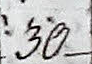30
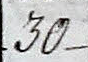30
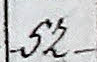52
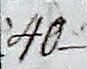40
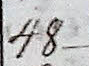48
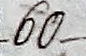60
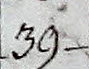39
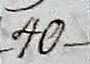40
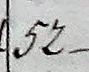52
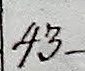43
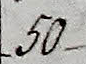50
